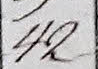42
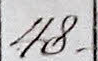48
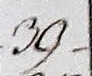39
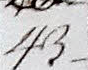43
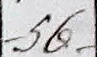56
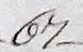67
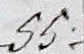55
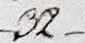32
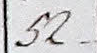52
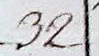32
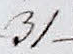31
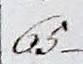65
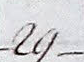29
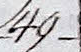49
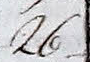26
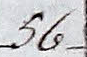56
